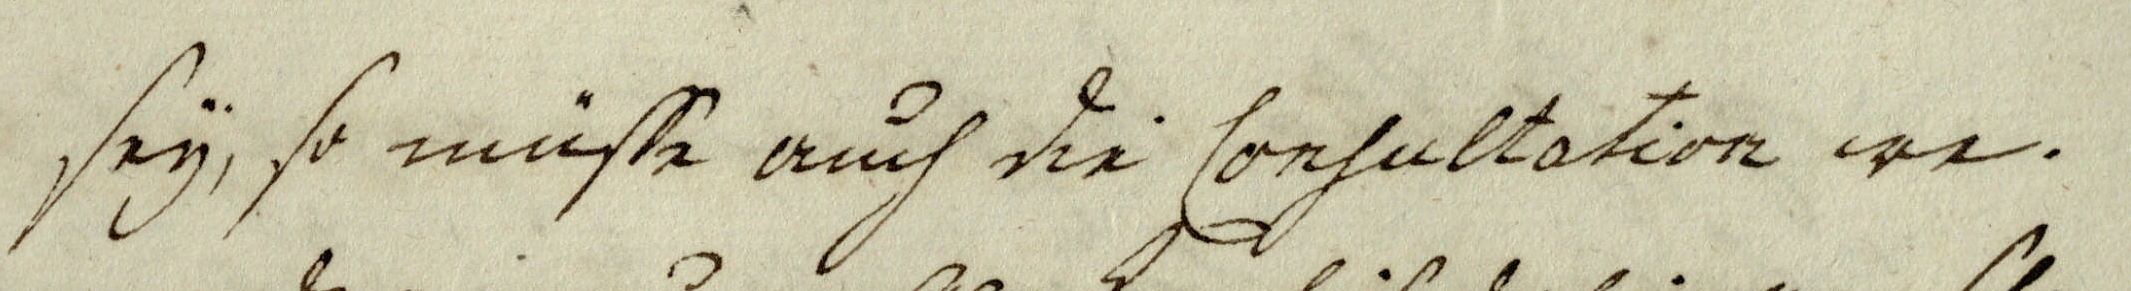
seÿ, so müsse auch die Consultation we¬
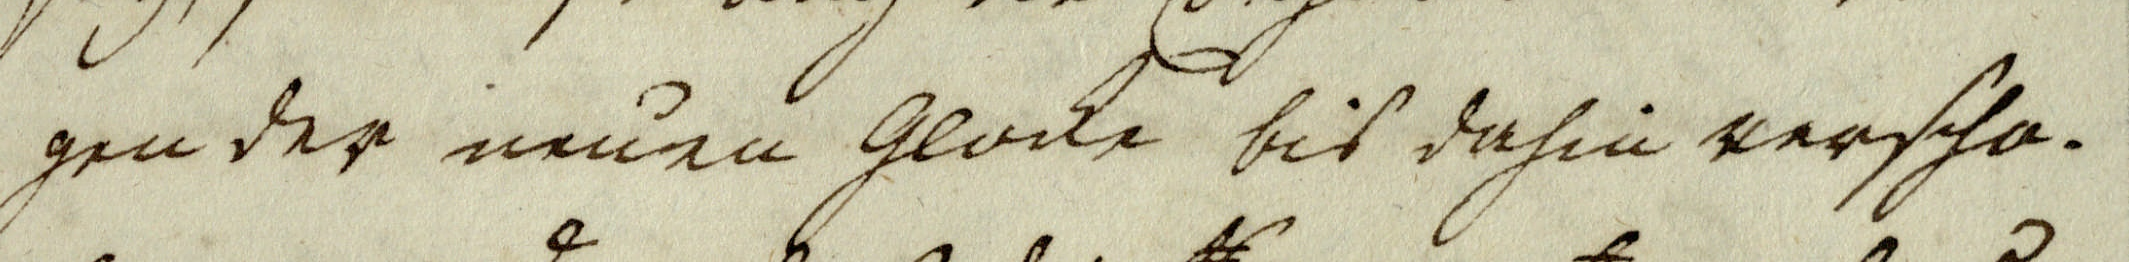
gen der neuen Glocke bis dahin verscho¬
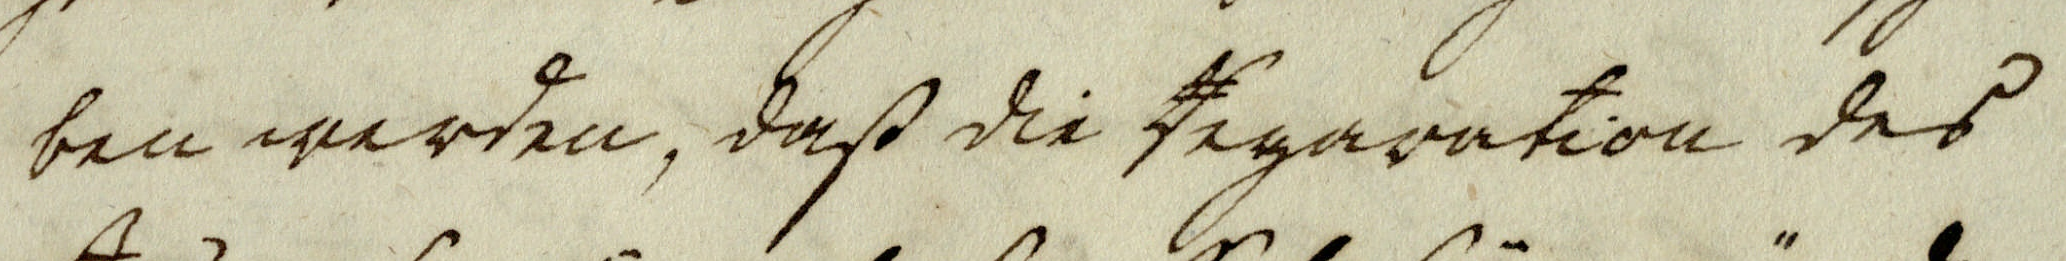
ben werden, daß die Reparation des
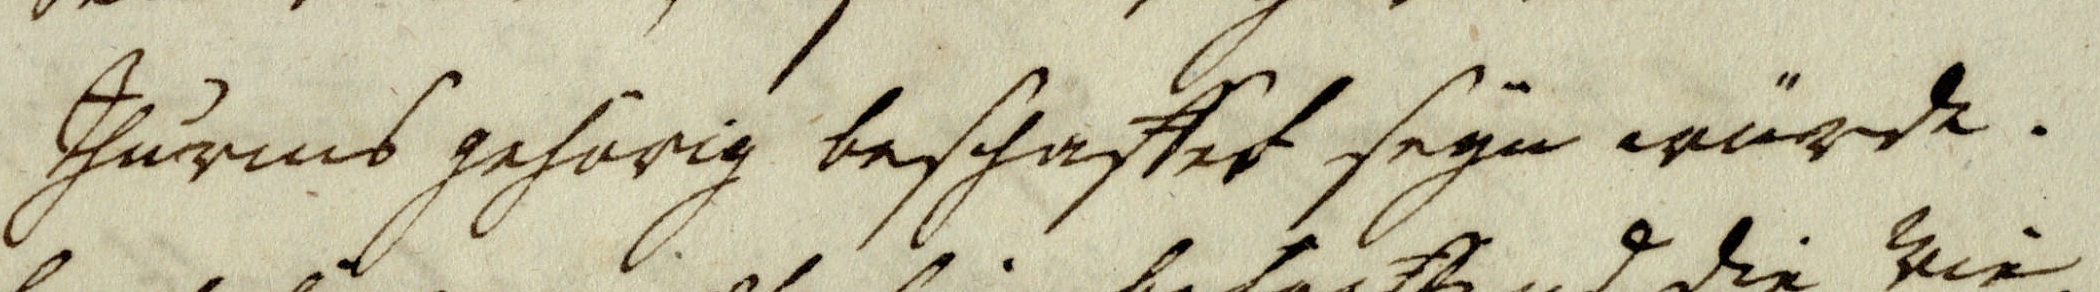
Thurms gehörig beschaffet seÿn würde.
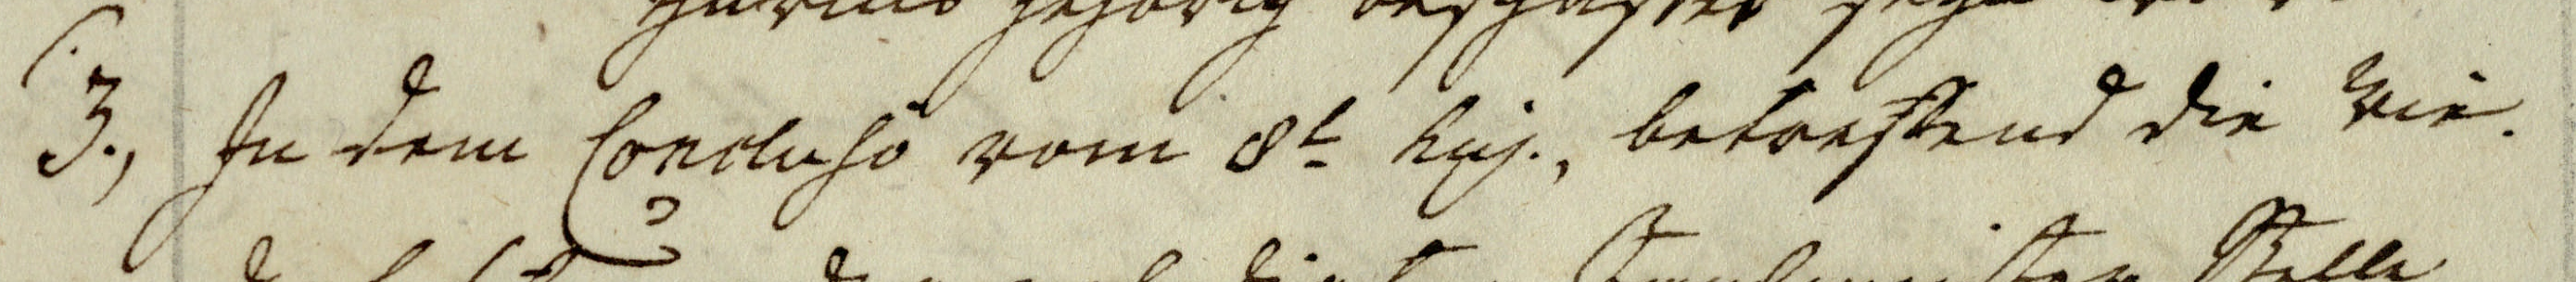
3., In dem Concluso vom 8 ten huj. betreffend die Wie¬
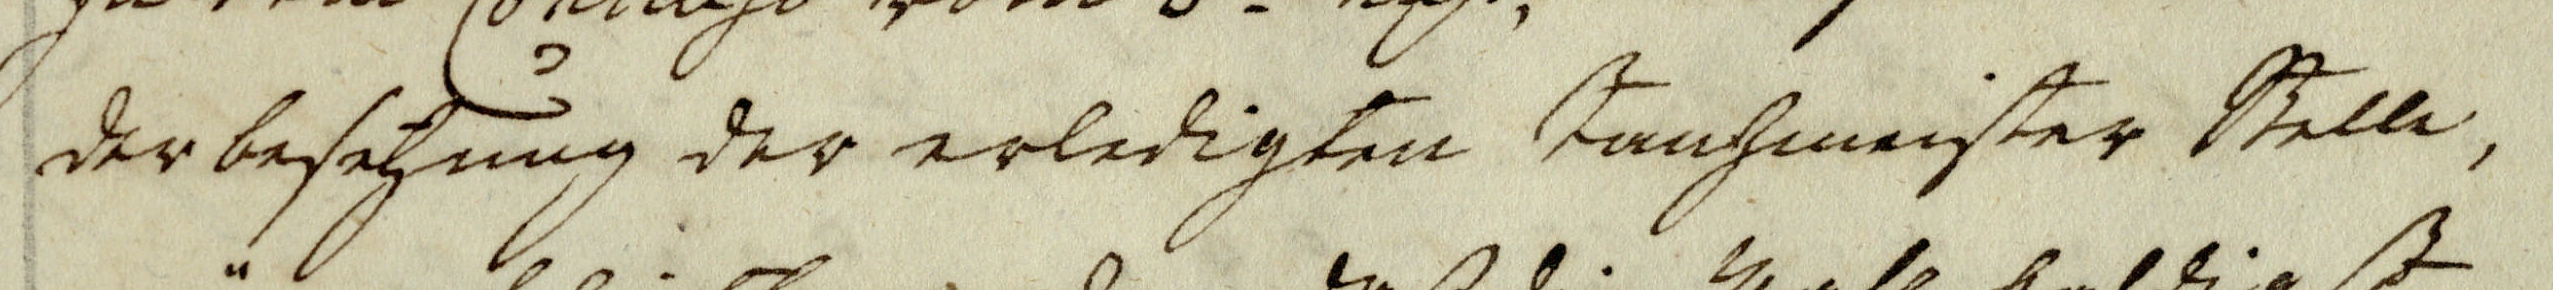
derbesetzung der erledigten Tanzmeister Stelle,
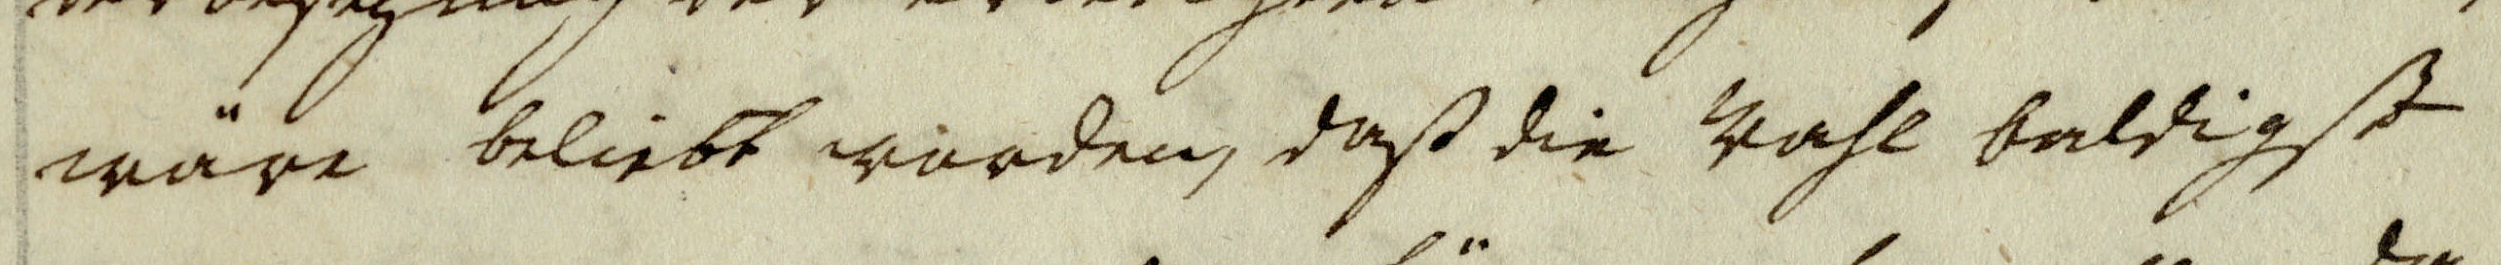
wäre beliebt worden, daß die Wahl baldigst
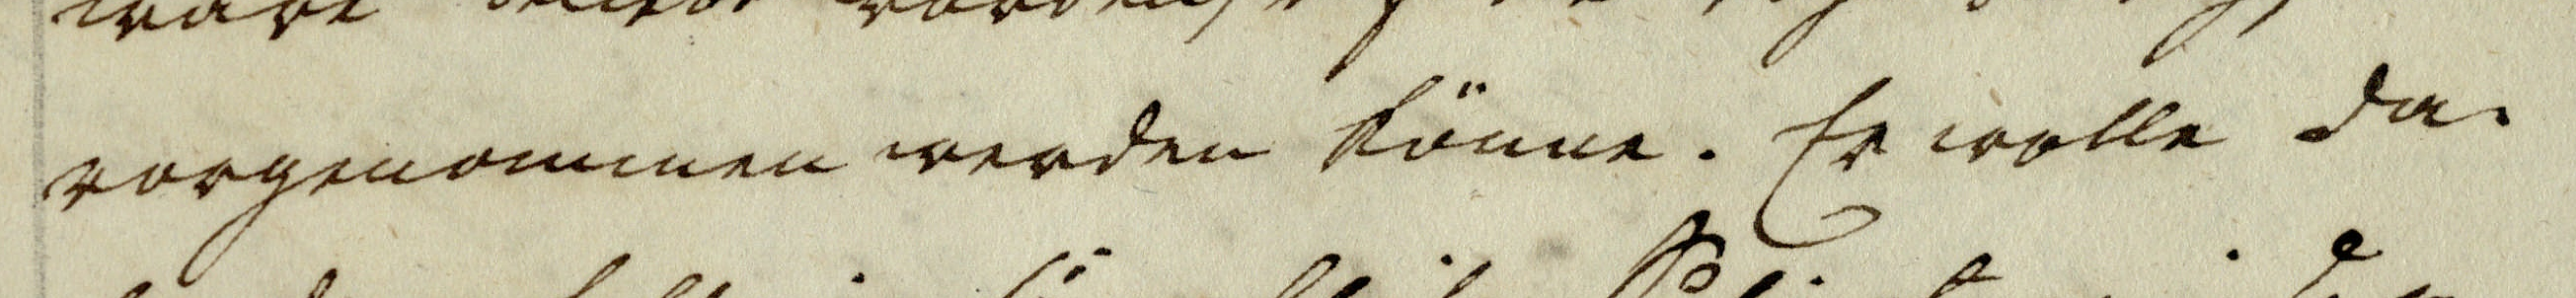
vorgenommen werden könne. Er wolle da¬
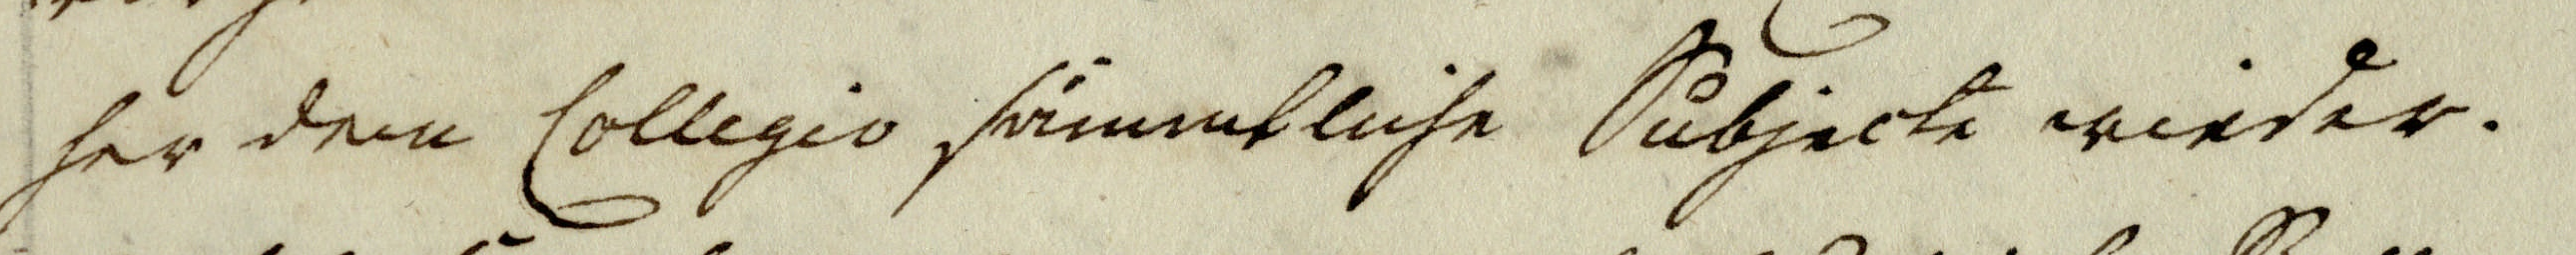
her dem Collegio sämmtliche Subjecte wieder¬
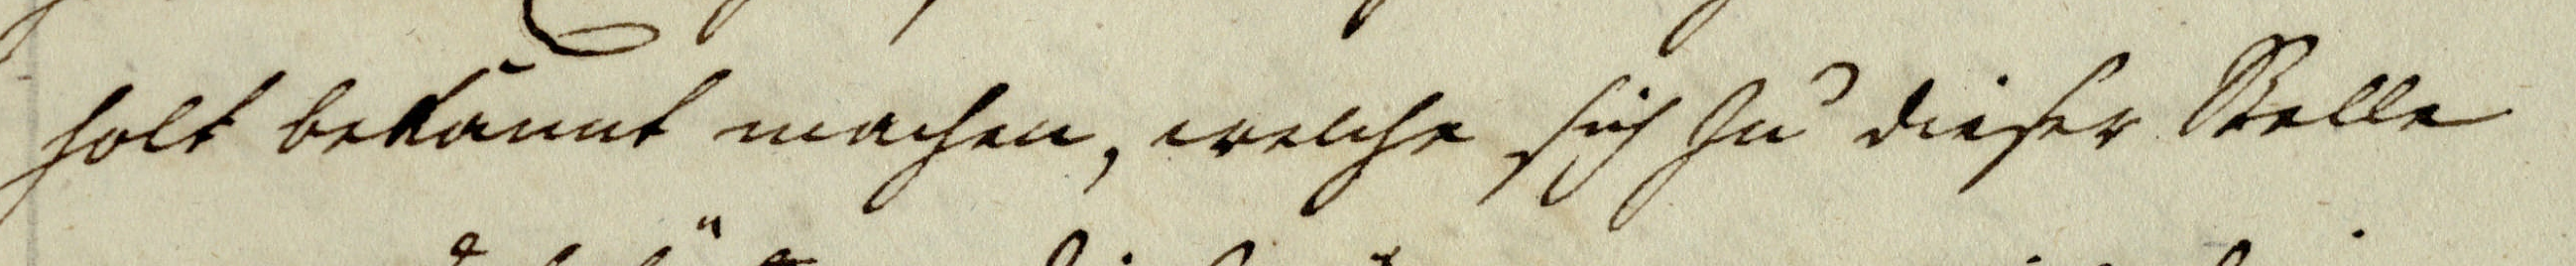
holt bekannt machen, welche sich zu dieser Stelle
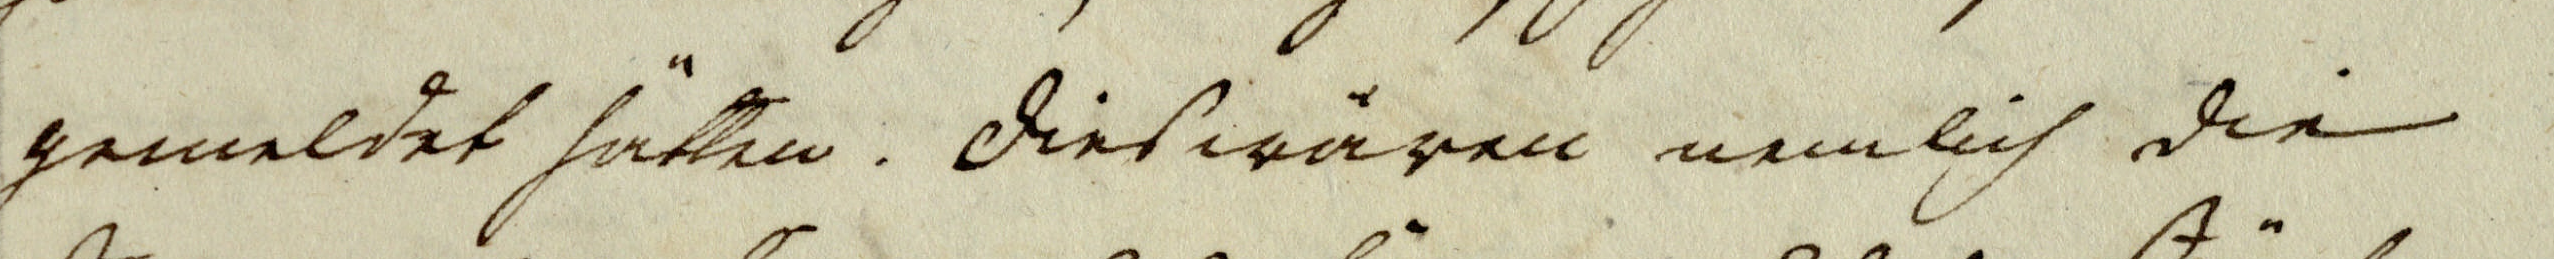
gemeldet hätten. Dies wären nemlich die
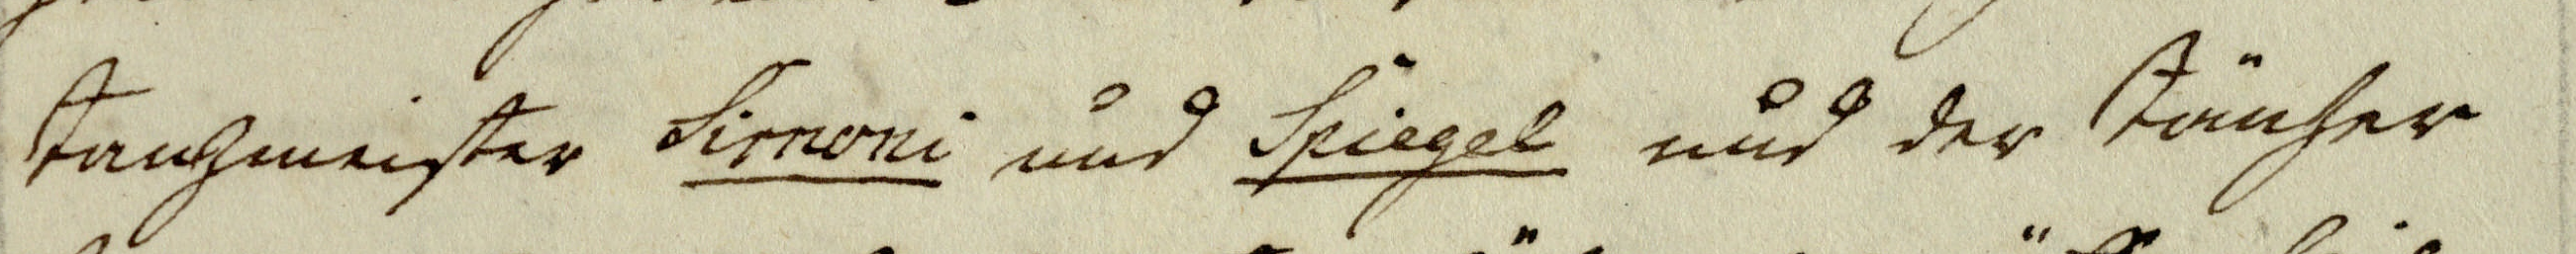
Tanzmeister Simoni und Spiegel und der Tänzer
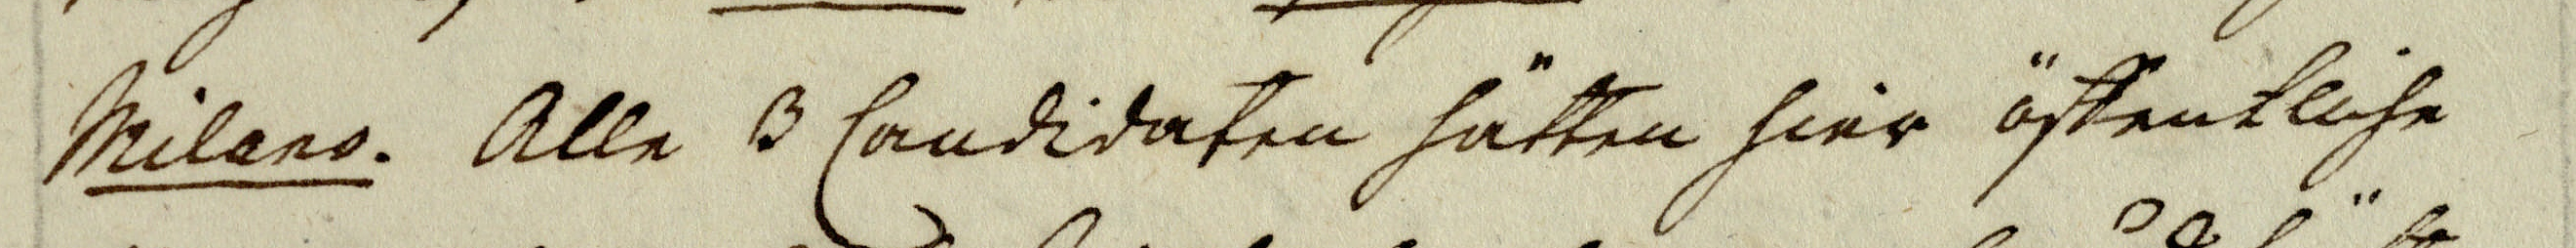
Milano. Alle 3 Candidaten hätten hier öffentliche
